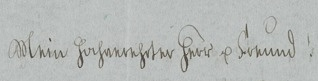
Mein hochverehrter Herr & Freund!
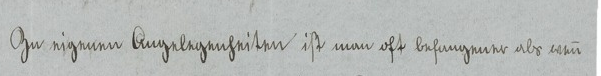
In eigenen Angelegenheiten ist man oft befangener als wenn
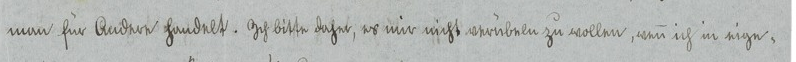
man für Andere handelt. Ich bitte daher, es mir nicht verübeln zu wollen, wenn ich in eige-
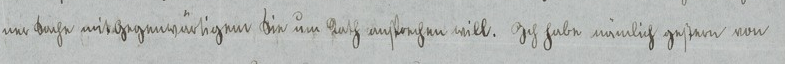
ner Sache mit Gegenwärtigem Sie um Rath ansprechen will. Ich habe nämlich gestern von
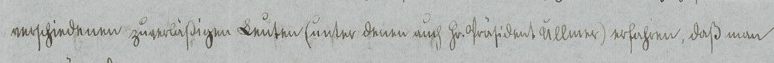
verschiedenen zuverläßigen Leuten (unter denen auch Hr Präsident Ullmer) erfahren, daß man
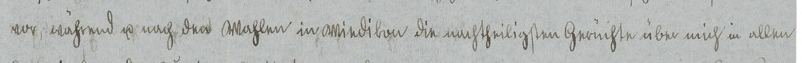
vor, während & nach den Wahlen in Wiedikon die nachtheiligsten Gerüchte über mich in allen
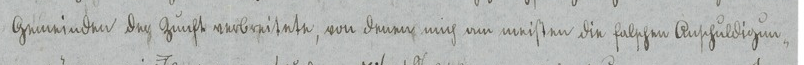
Gemeinden der Zunft verbreitete, von denen mich am meisten die falschen Anschuldigun-
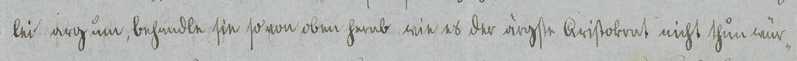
lei arg um, behandle sie so von oben herab wie es der ärgste Aristokrat nicht thun wür-
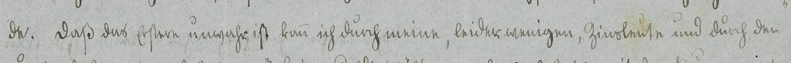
de. Daß das Erstere unwahr ist kann ich durch meine, leider wenigen, Zinsleute und durch den
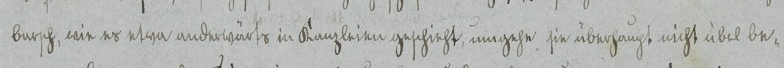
barsch, wie es etwa anderwärts in Kanzleien geschieht, umgehe sie überhaupt nicht übel be-
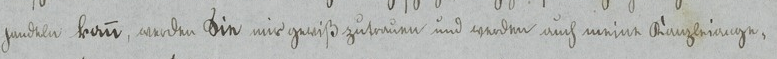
handle kann, werden Sie mir gewiß zutrauen und werden auch meine Kanzleiange-
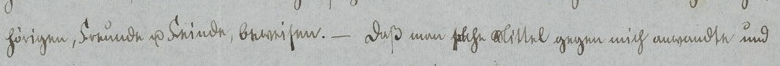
hörigen, Freunde & Feinde, beweisen. – Daß man solche Mittel gegen mich anwandte und
